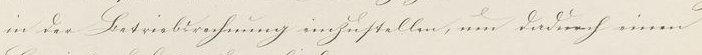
in der Betriebsrechnung einzustellen, um dadurch einen
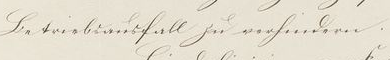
Betriebsausfall zu verhindern.
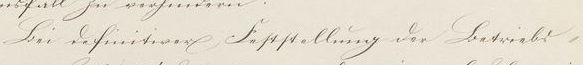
Bei definitiver Feststellung der Betriebs-
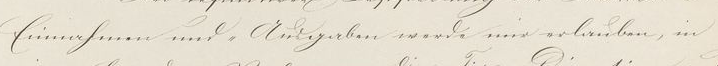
Einnahmen und -Ausgaben werde mir erlauben, in
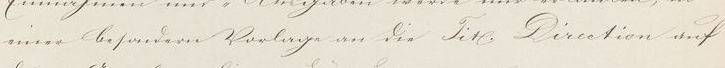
einer besondern Vorlage an die Tit. Direction auf
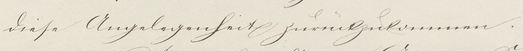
diese Angelegenheit zurückzukommen.
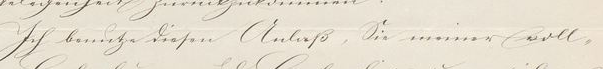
Ich benutze diesen Anlaß, Sie meiner voll-
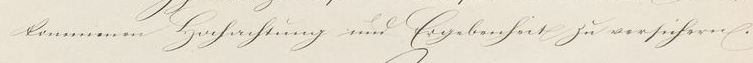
kommenen Hochachtung und Ergebenheit zu versichern.
